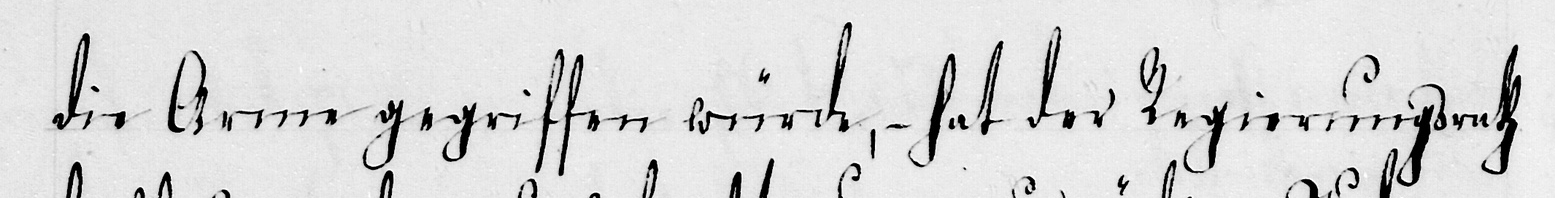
die Arme gegriffen würde, – hat der Regierungsrath
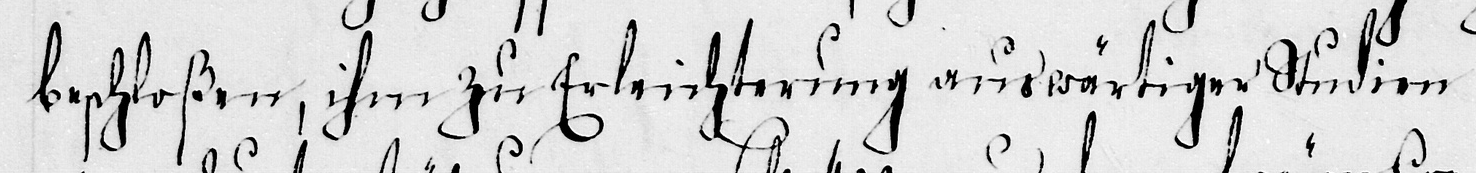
beschloßen, ihm zu Erleichterung auswärtiger Studien
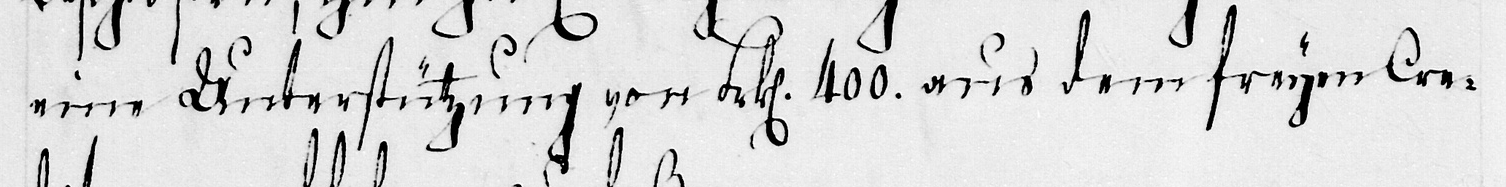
eine Unterstützung von Frk[en]. 400. aus dem freyen Cre¬
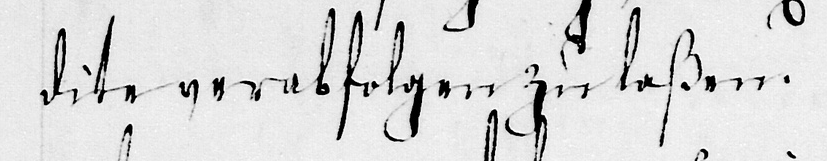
dite verabfolgen zu laßen.
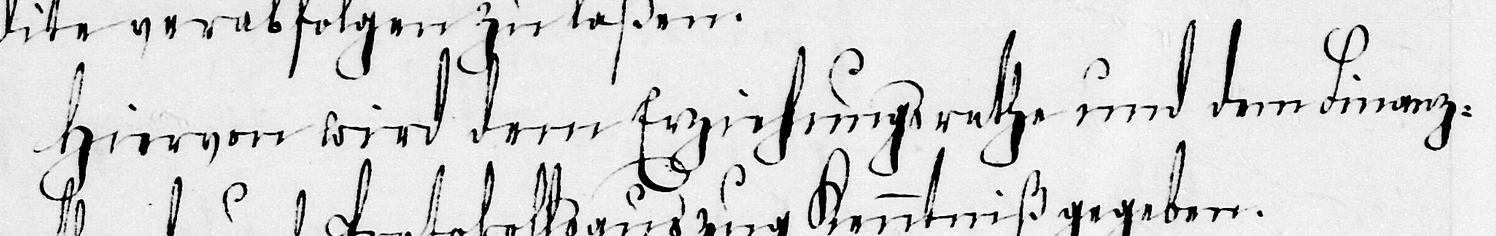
Hiervon wird dem Erziehungsrathe und dem Finanz¬
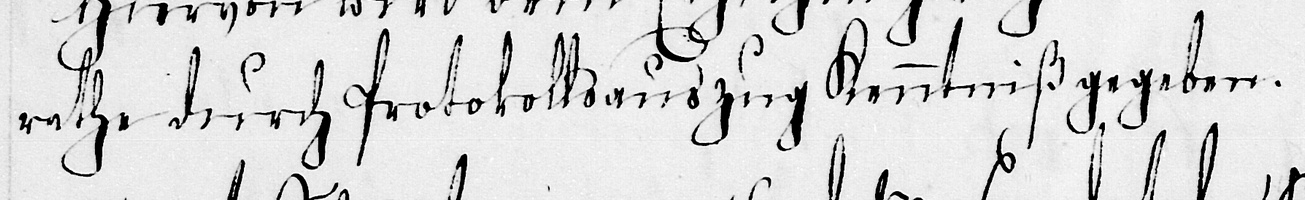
rathe durch Protokollsauszug Kenntniß gegeben.
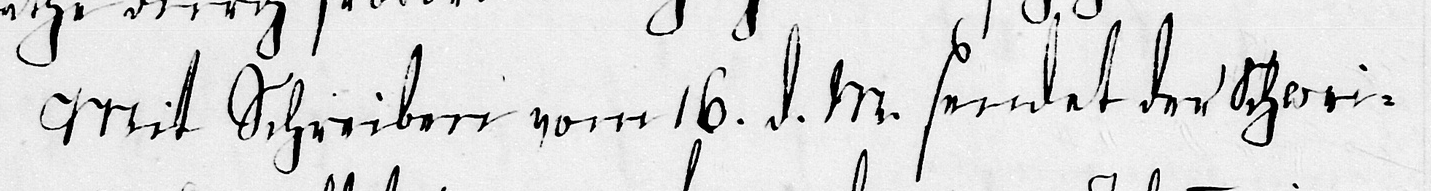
Mit Schreiben vom 16. d. M. sendet der Schwei¬
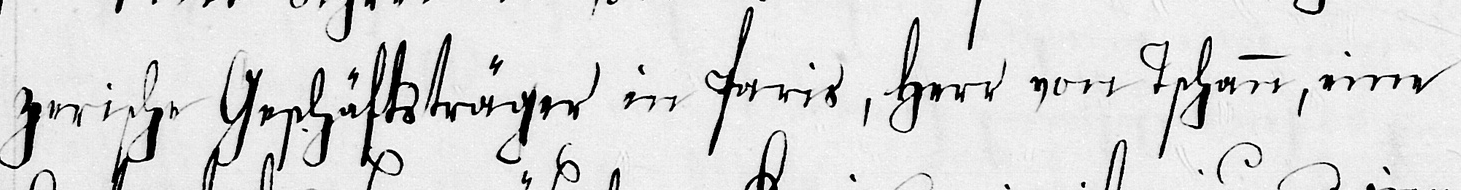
zerische Geschäftsträger in Paris, Herr von Tschann, eine
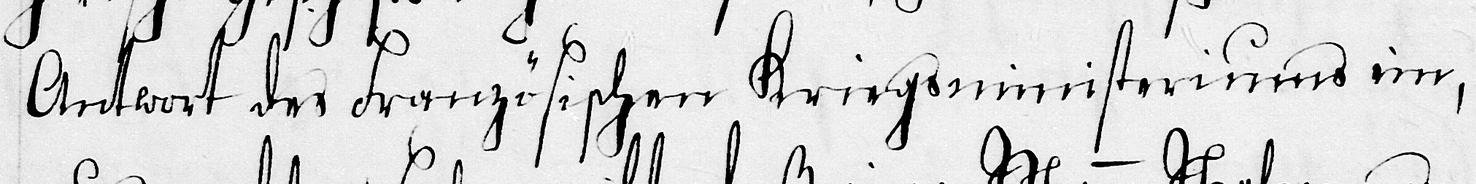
Antwort des Französischen Kriegsministeriums ein,
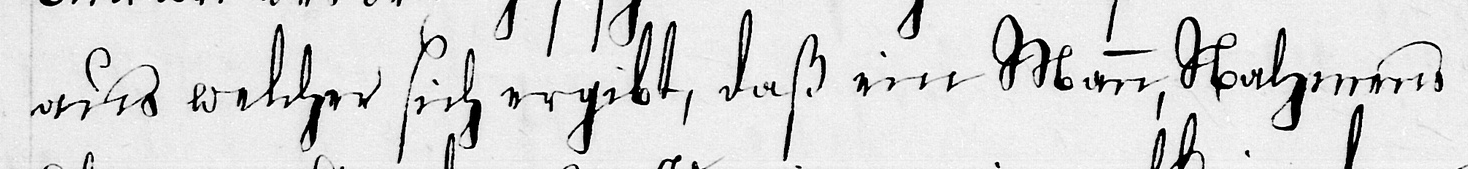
aus welcher sich ergibt, daß ein Mann, Nahmens
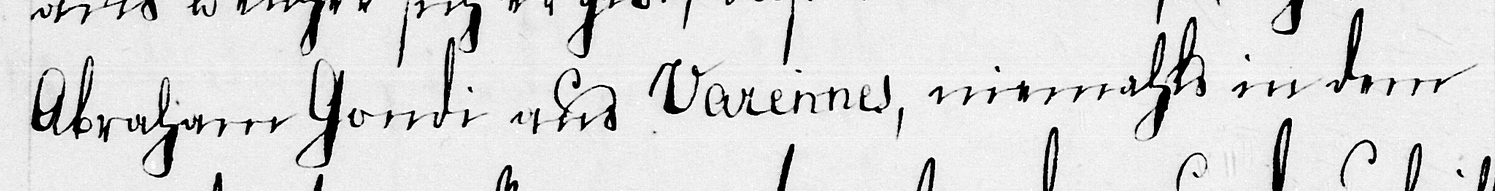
Abraham Gondi aus Verennes, niemahls in dem
